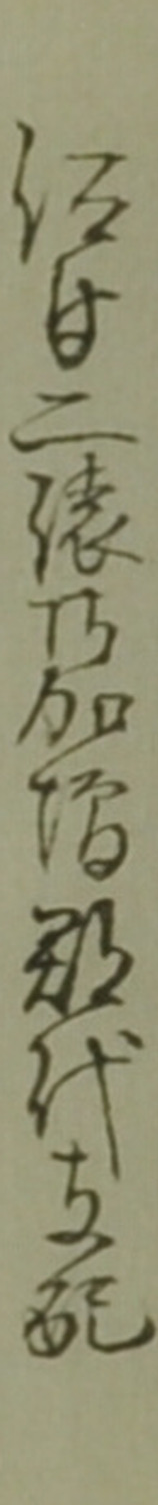仰付二俵御加増郡代支配
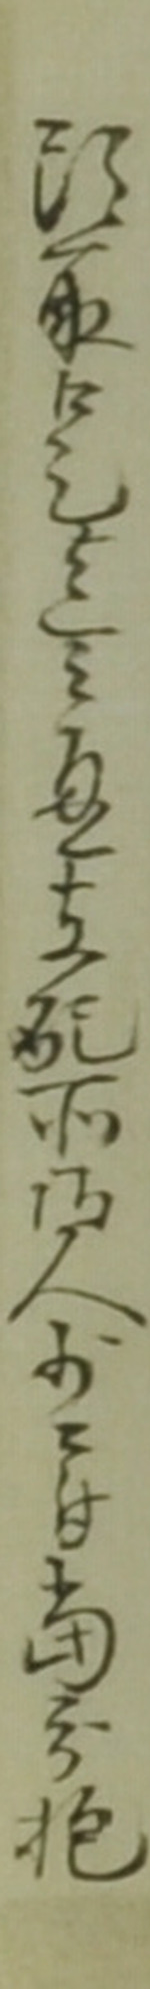頭取是迄之通支配所御人少ニ付当分抱
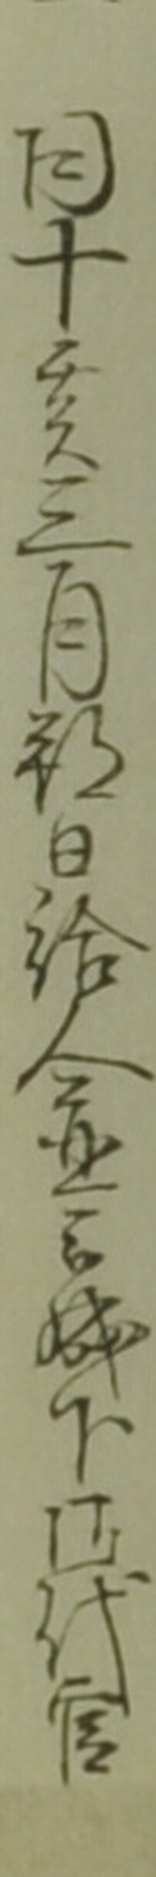一同十亥三月朔日給人並被成下御代官

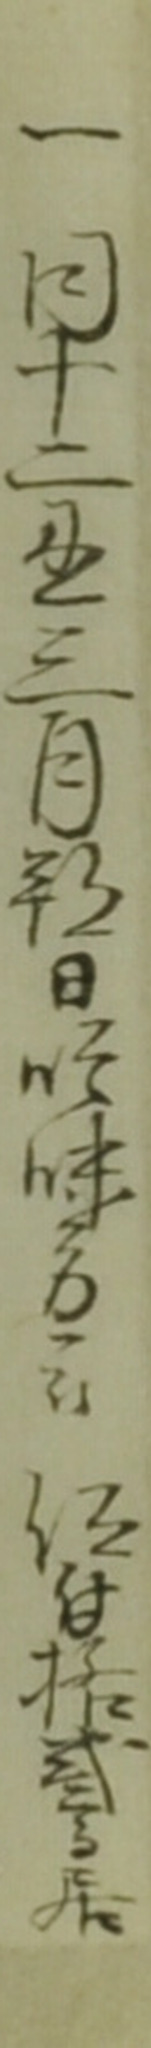一同十二丑三月朔日吟味方被仰付格式高居
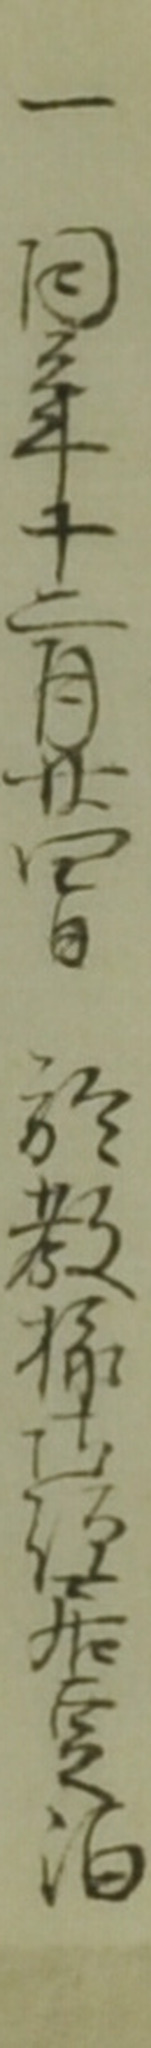一同年十二月廿四日於教様御住居定泊
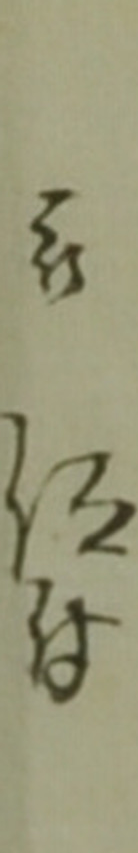被仰付
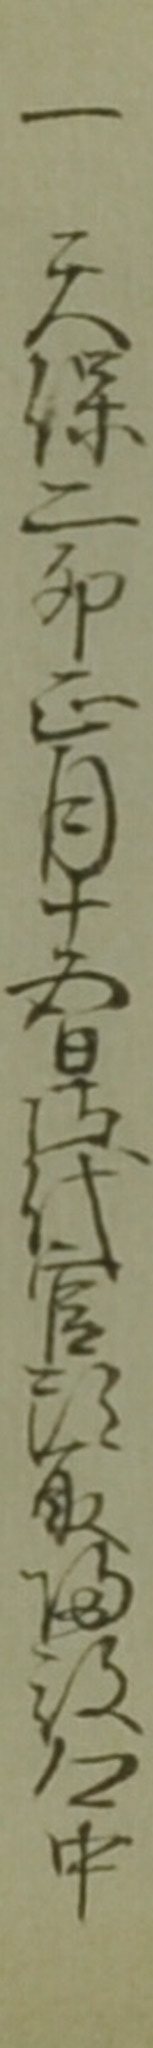一天保二卯正月十五日御代官頭取帰役郷中
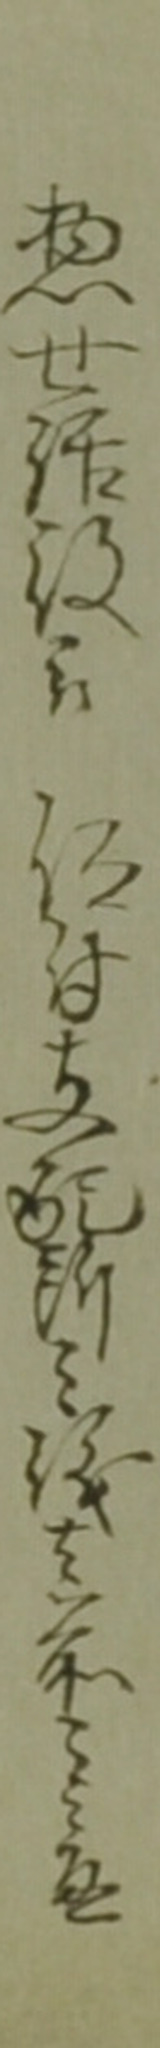惣世話役被仰付支配所之儀者前々之通
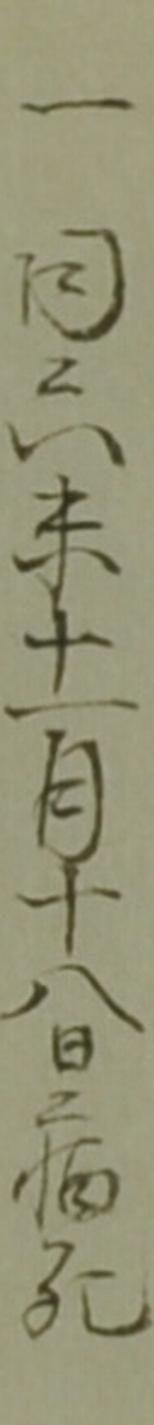一同六未十一月十八日病死
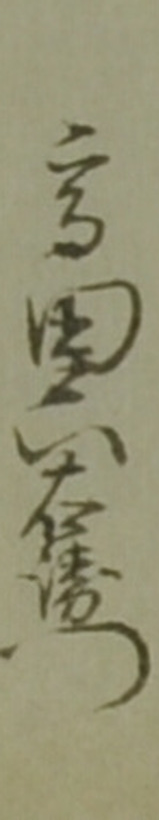高田六右衛門
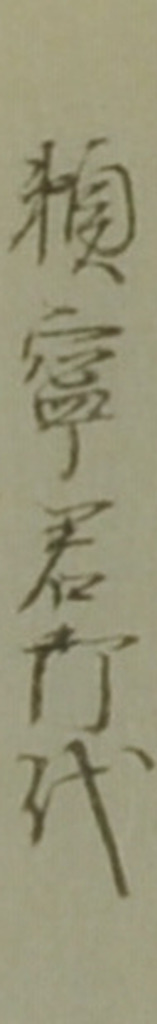頼寧君御代
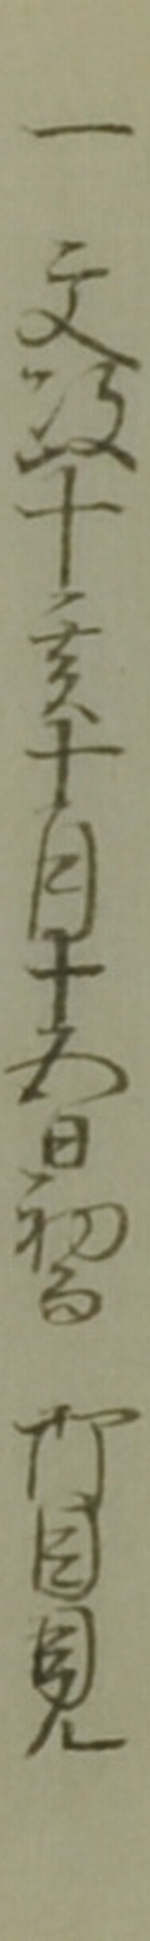一文政十亥十月十五日初而御目見
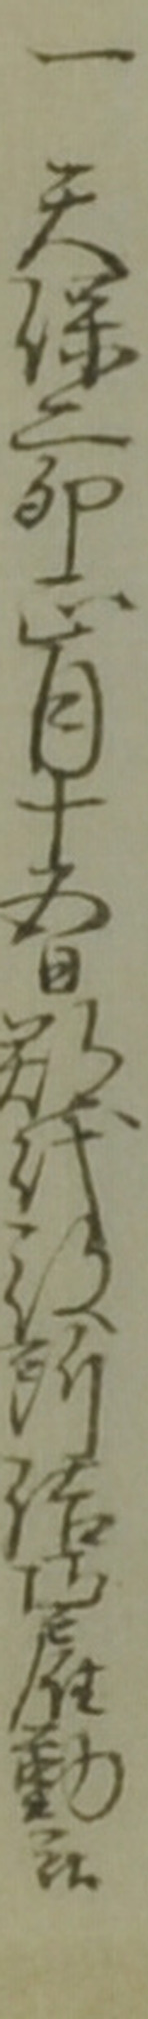一天保二卯正月十五日郡代役所詰御雇勤被
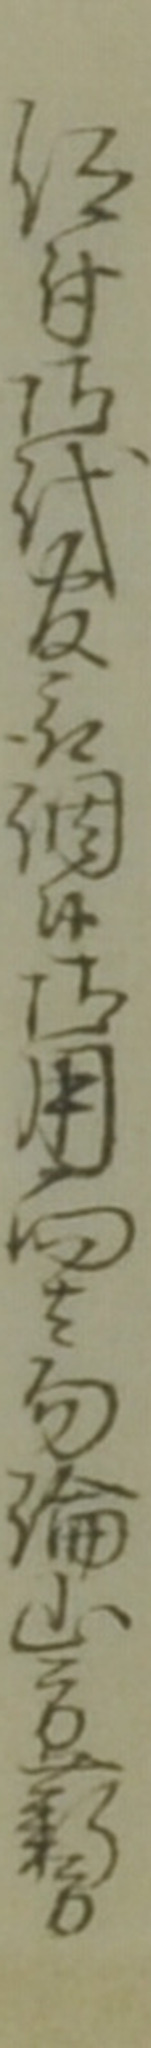仰付御代官取調候御用向者勿論山方薪方
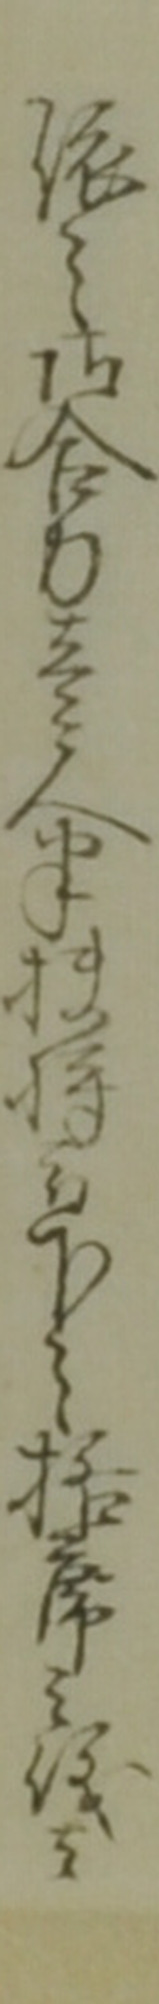依之御合力壱人半扶持被下之格席之儀者
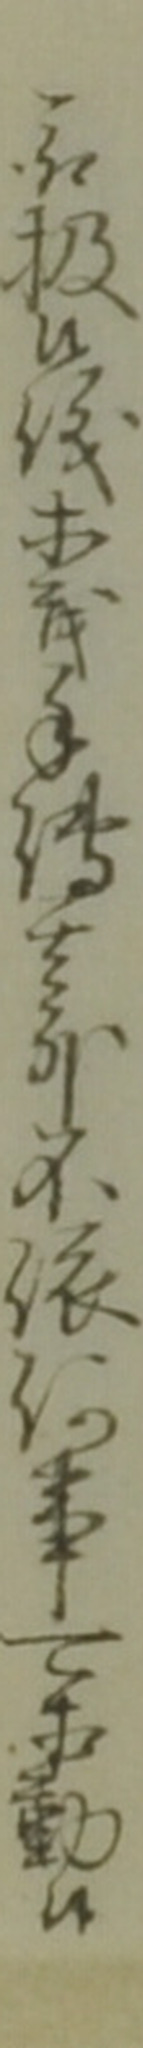取扱候儀等茂手伝其外不依何事可相勤候
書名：無足諸士勤仕録（一）
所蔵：伊那市立高遠町図書館・合同会社AMANE
